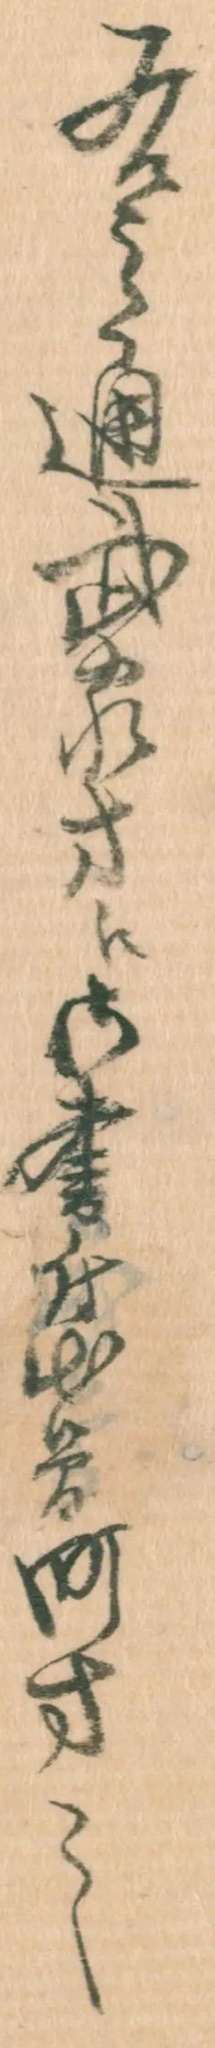右之通武家方え御書付出候間町方之
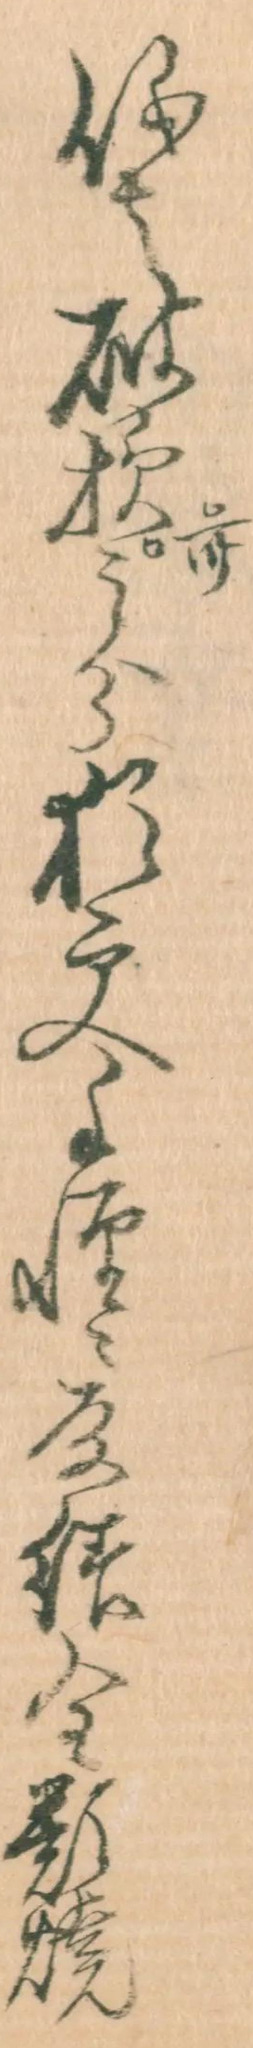儀は破損所之分猶更手軽ニ及繕全類焼
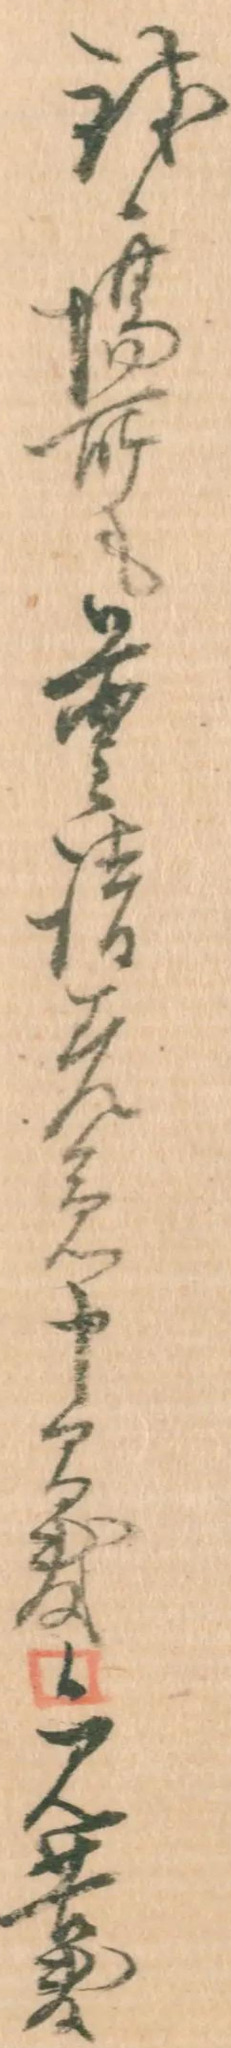致候場所も普請差急申間敷候見苦敷
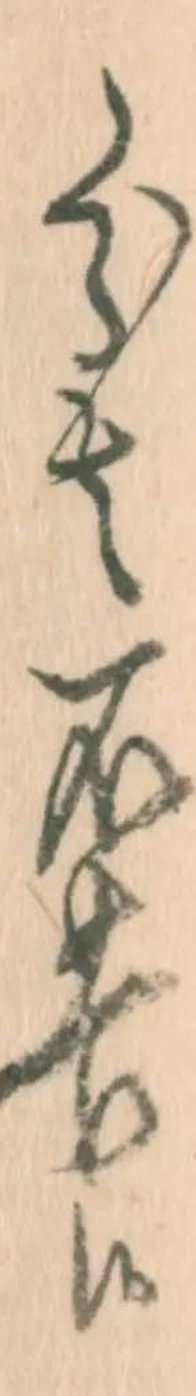分は不苦候
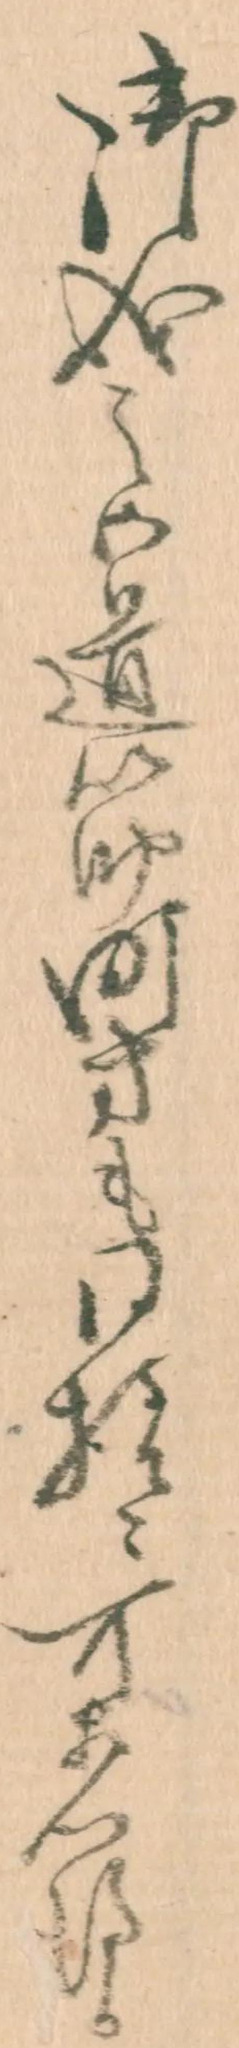御成之御道筋町方も同様ニ可相心得候
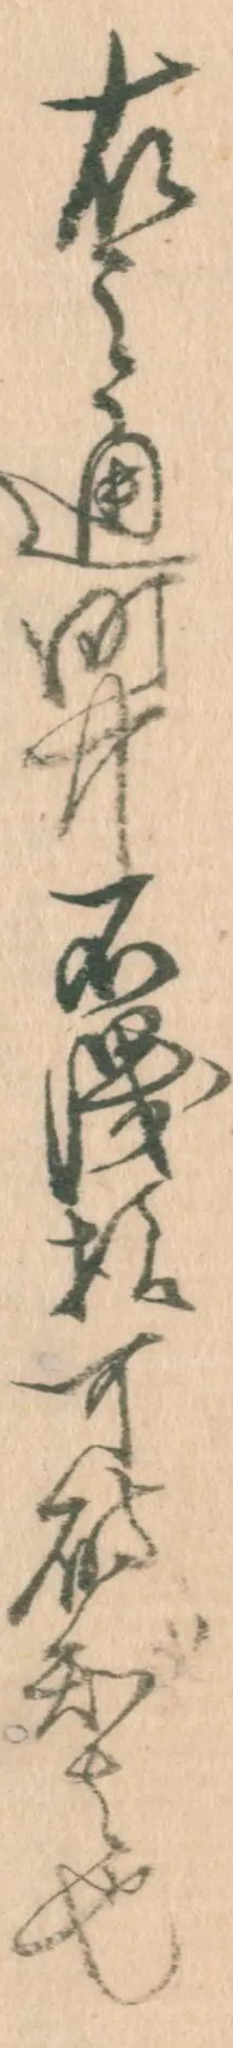右之通町中不洩様可触知者也

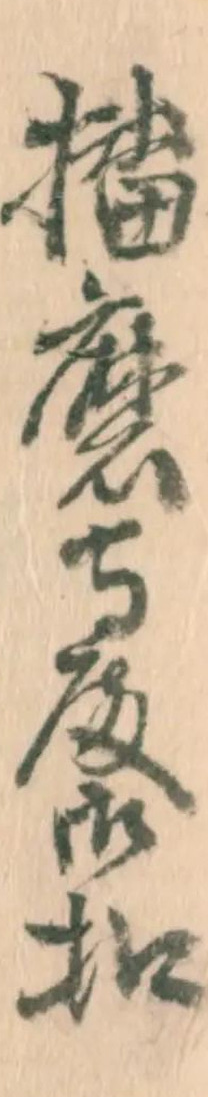播磨守殿御扣
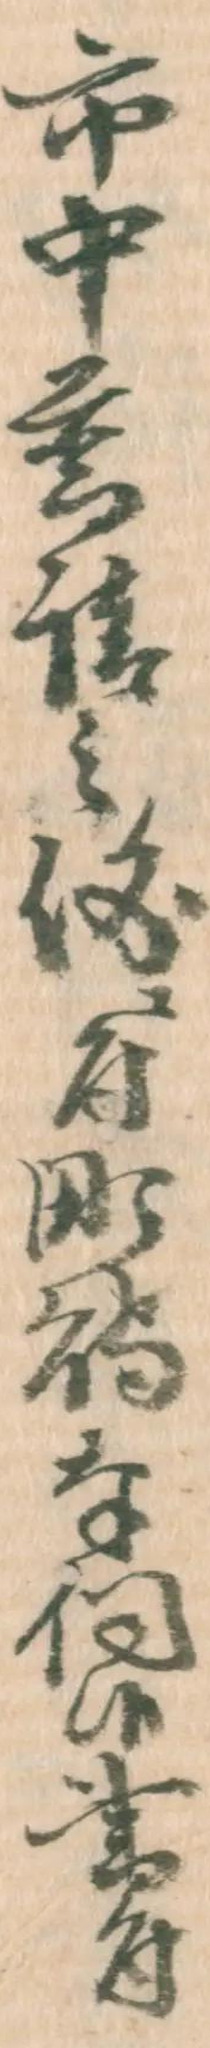│市中普請之儀ニ付町触奉伺候書付
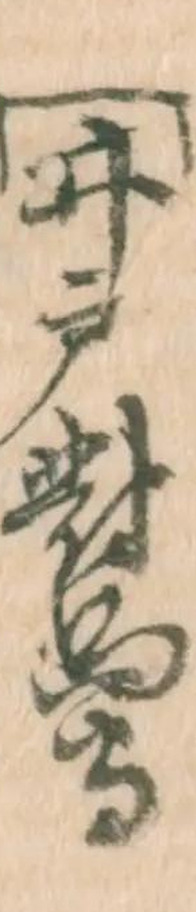│[井戸対馬守
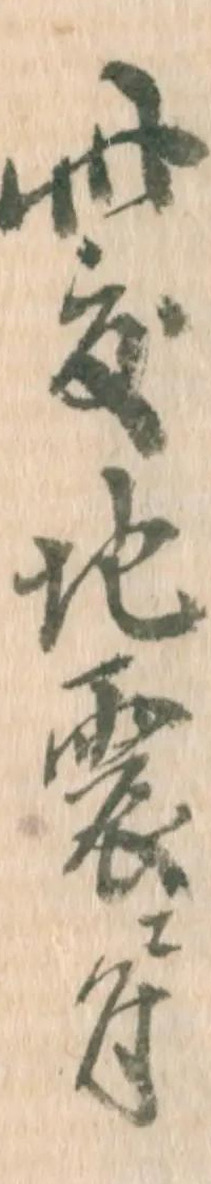此度地震ニ付
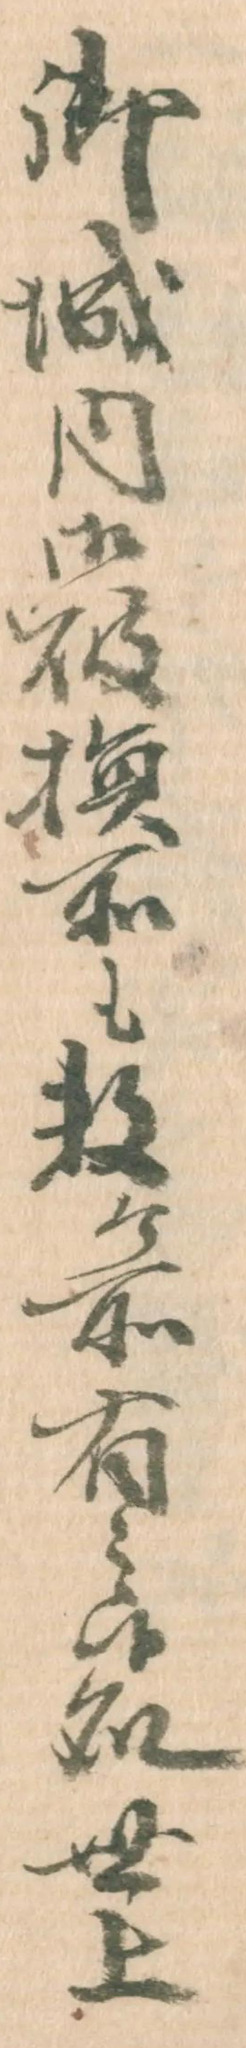御城内御破損所も数ケ所有之候処世上

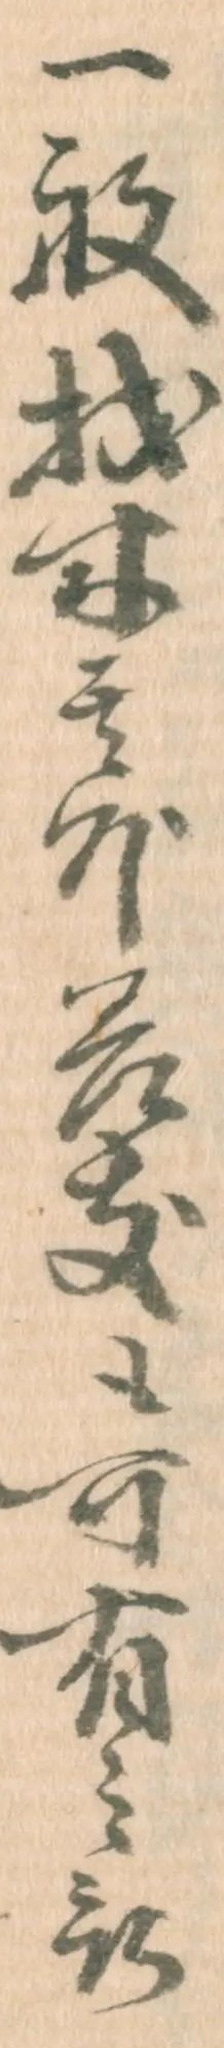一般材木其外差支も可有旨被
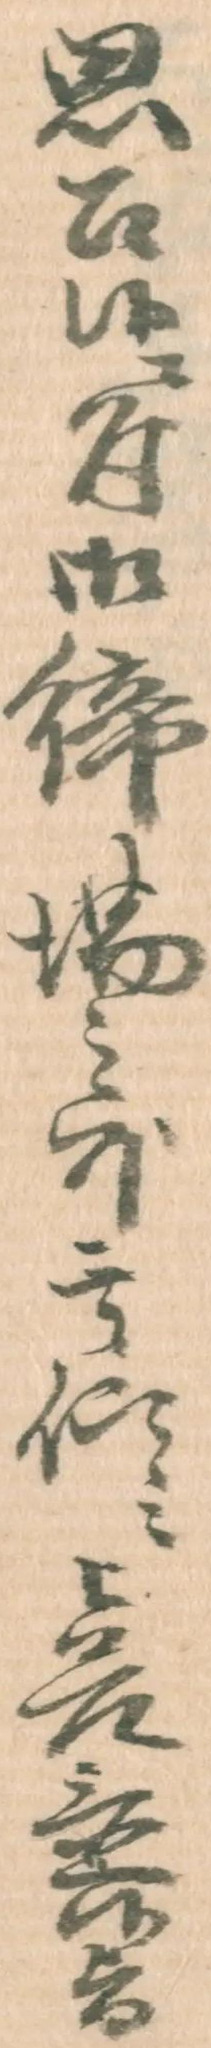思召候ニ付御締之場之外其儘ニ被差置候旨
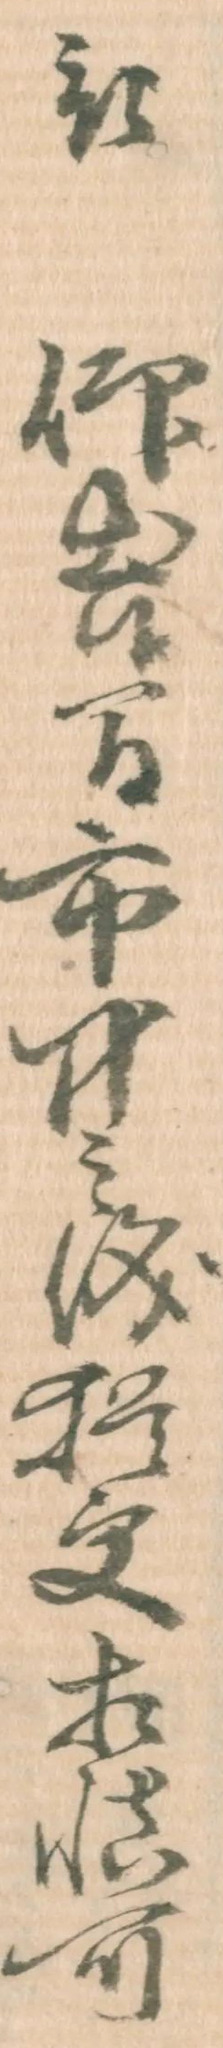被仰出候間市中之儀猶更相慎可
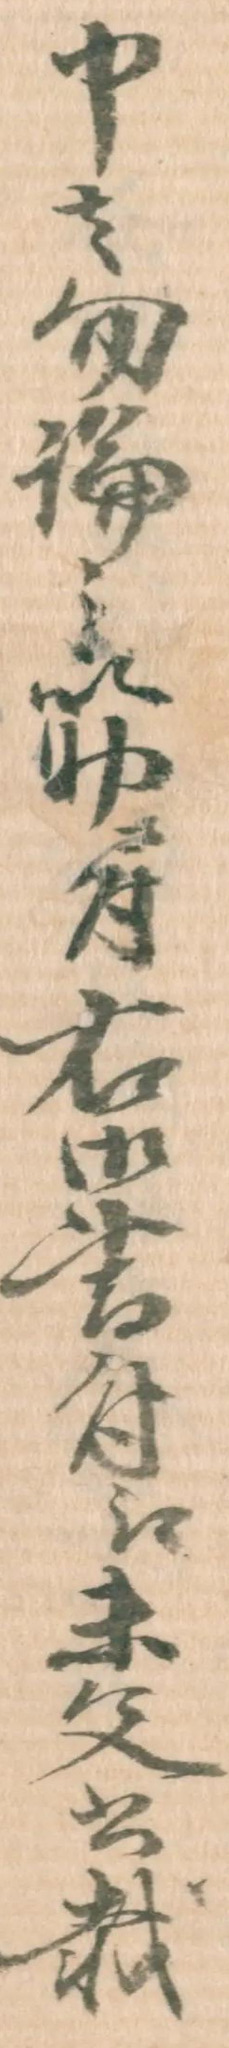申は勿論之筋ニ付右御書付え末文書載
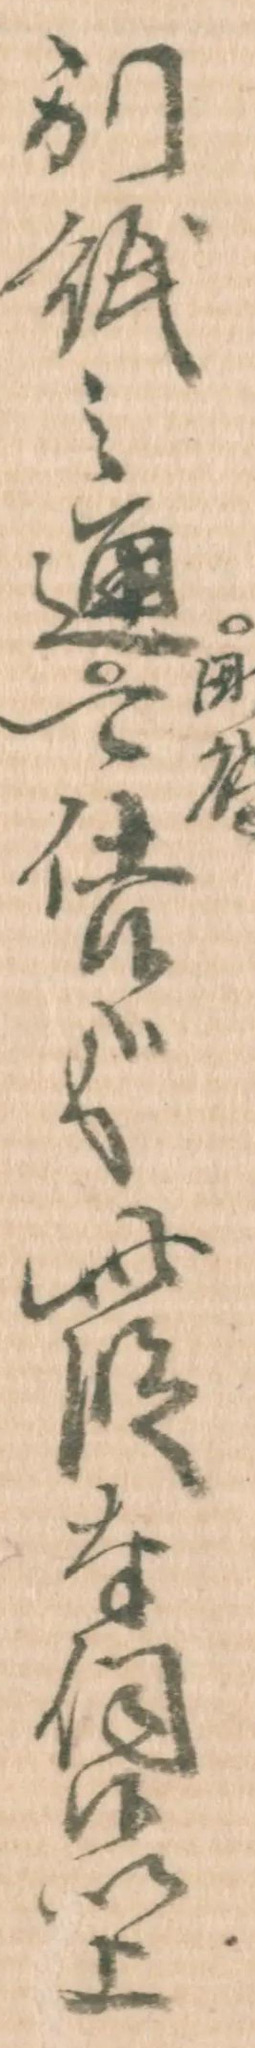別紙之通町触仕候哉此段奉伺候以上
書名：地震災書留 2巻. [2] 内表紙に「地震一件　安政二卯年十月」とあり
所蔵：国立国会図書館 National Diet Library, JAPAN
